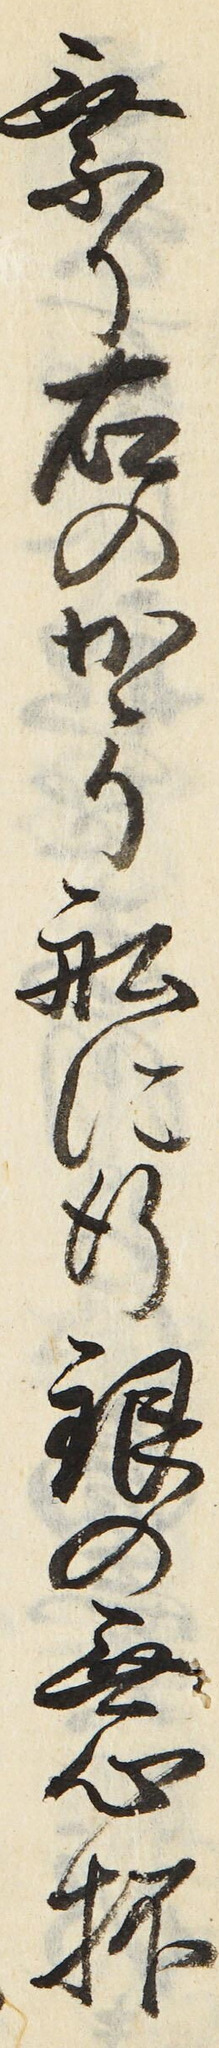乗り右のかゝり船に行銀の無心抔
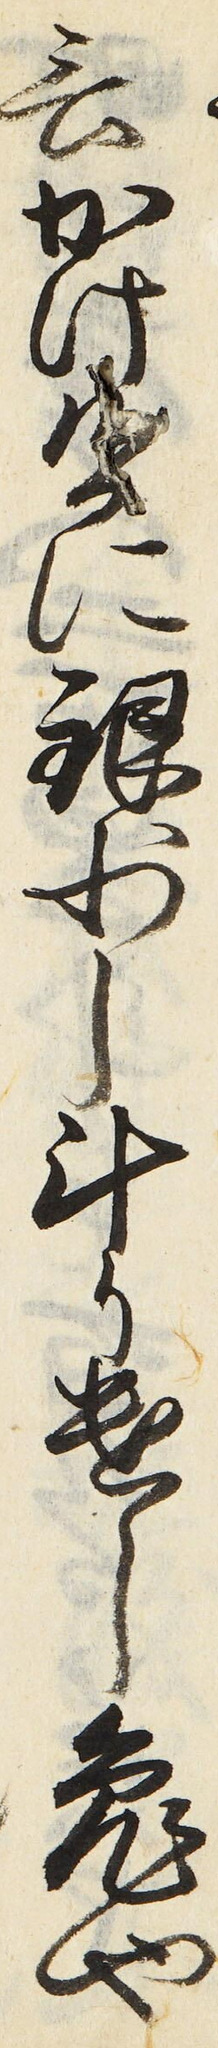云かけけるに銀少し計り遣しとや
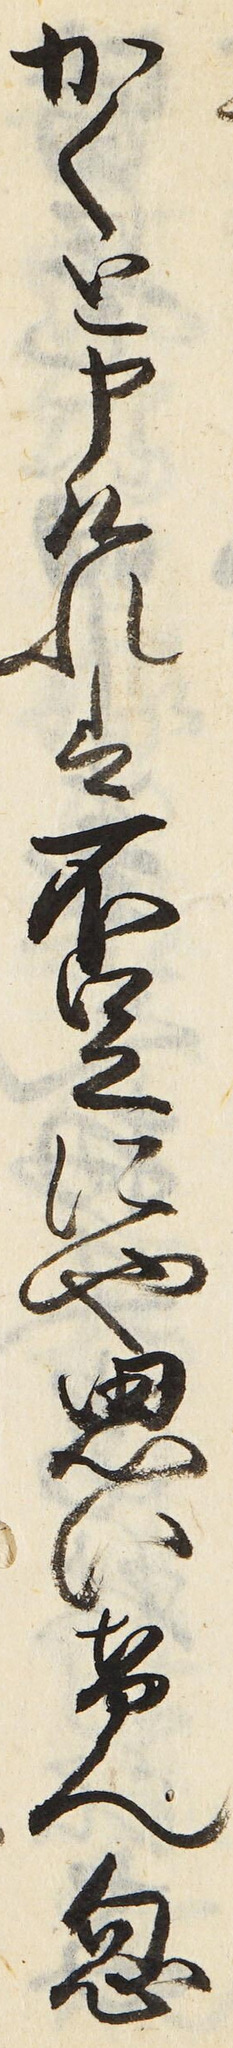かくと申けれは不足にや思ひけん忽
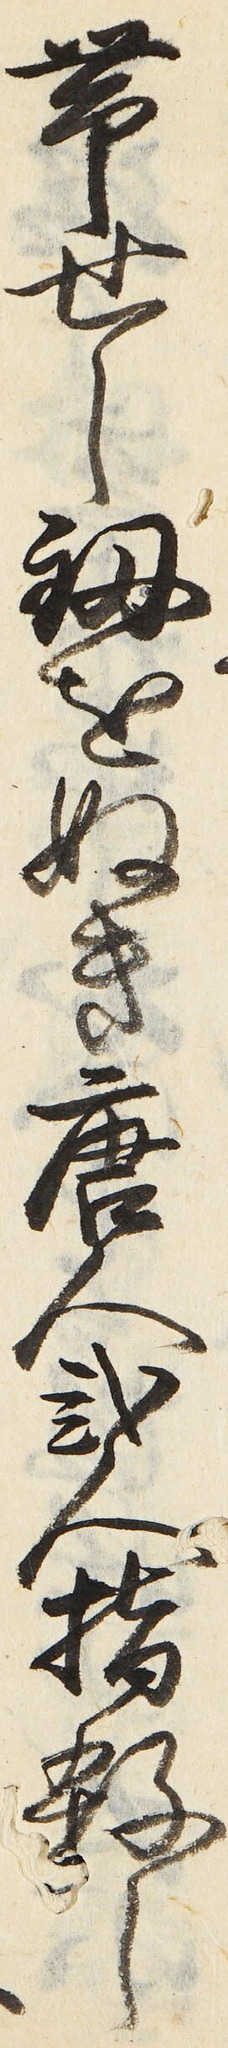帯せし釼をぬき唐人弐人指殺し
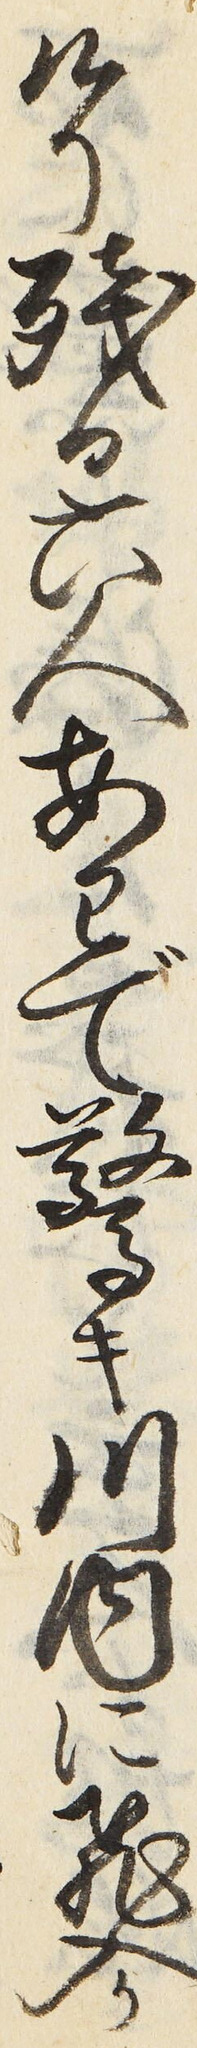けり残る六人あわで驚き川内に飛入り
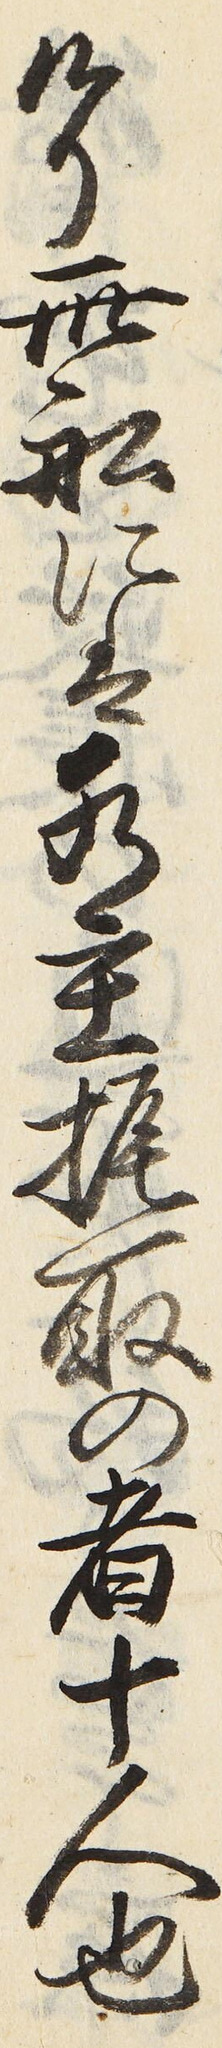けり此船には水主梶取の者十人也
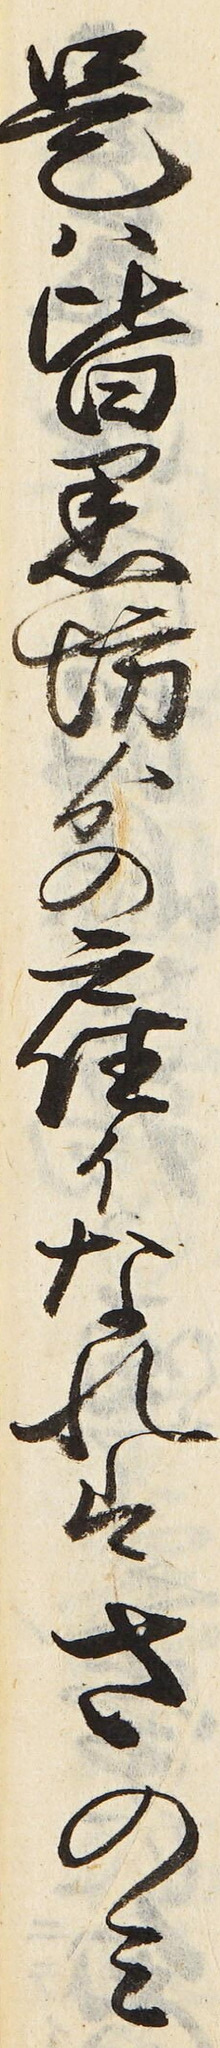是は皆黒坊ゟの雇いなれはさのみ
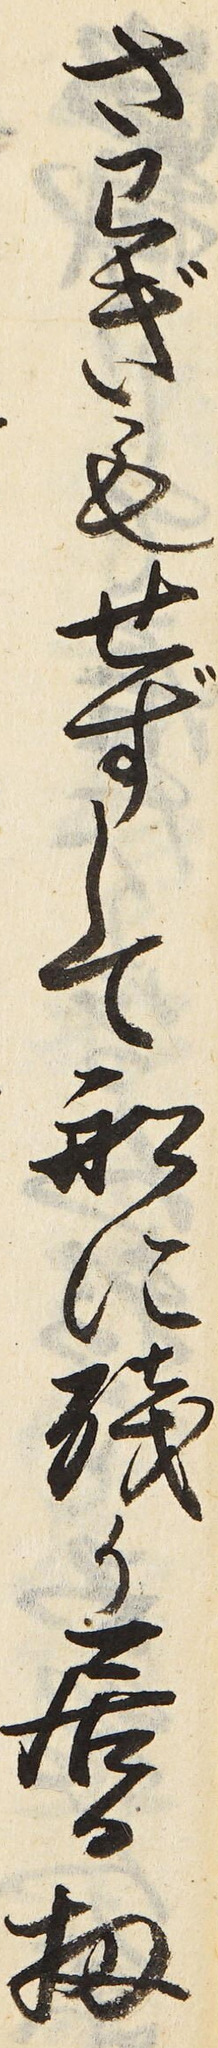さわぎもせずして船に残り居る扨
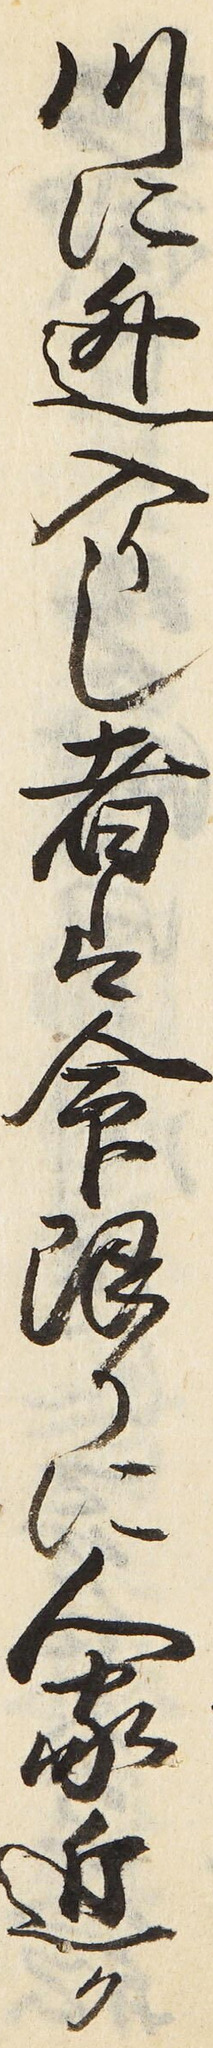川に逃入りし者は命限りに人家近く
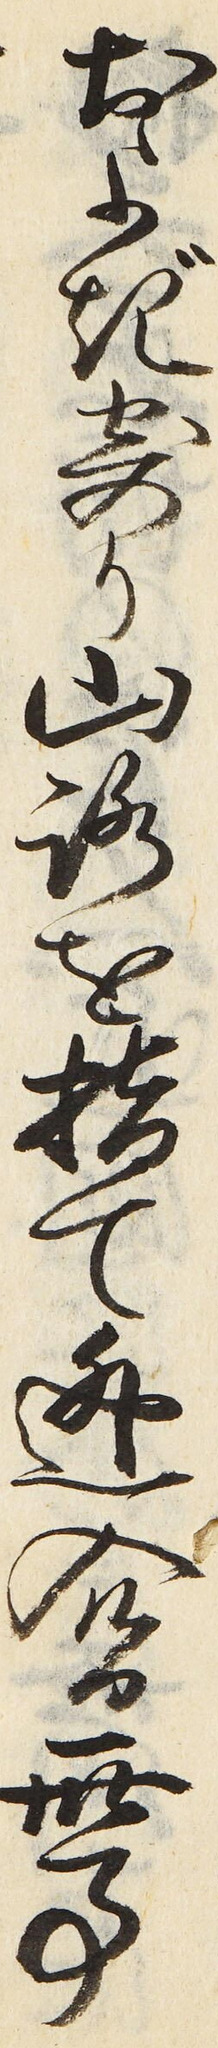およぎ寄り山路を指て逃入ける此事
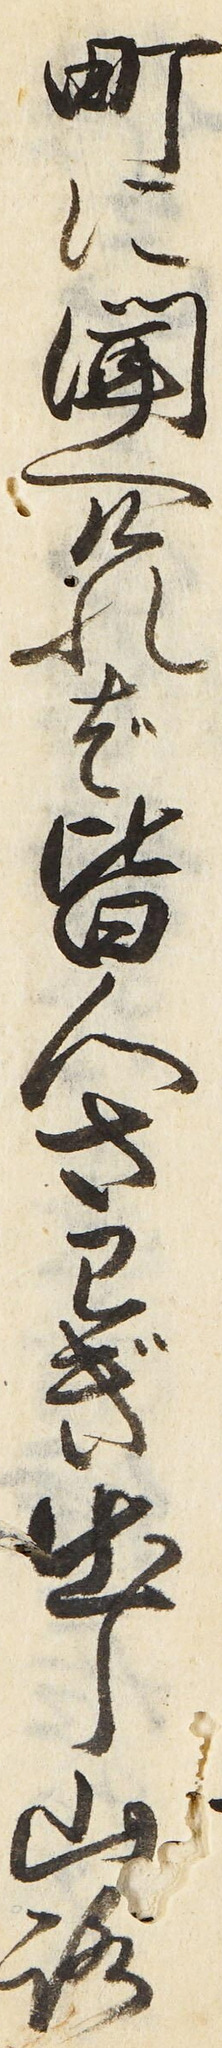町に聞へければ皆人さわぎ出し山路
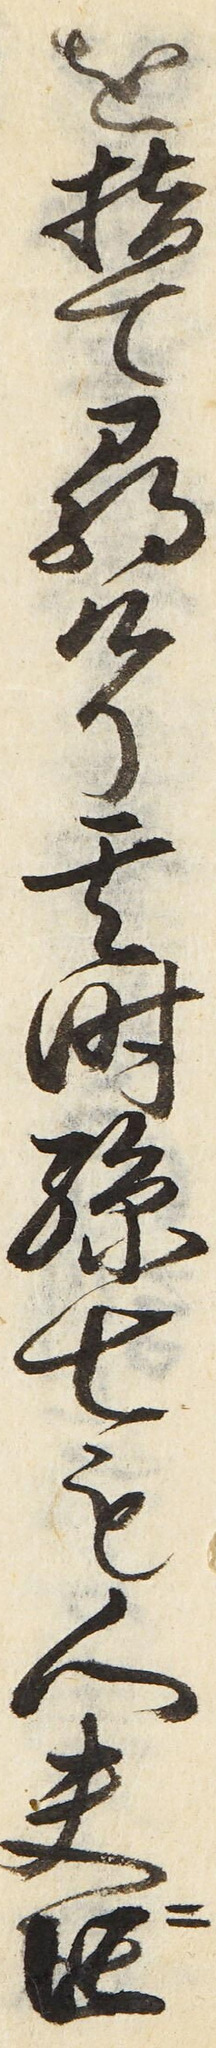を指て尋けり其時孫七も人夫に
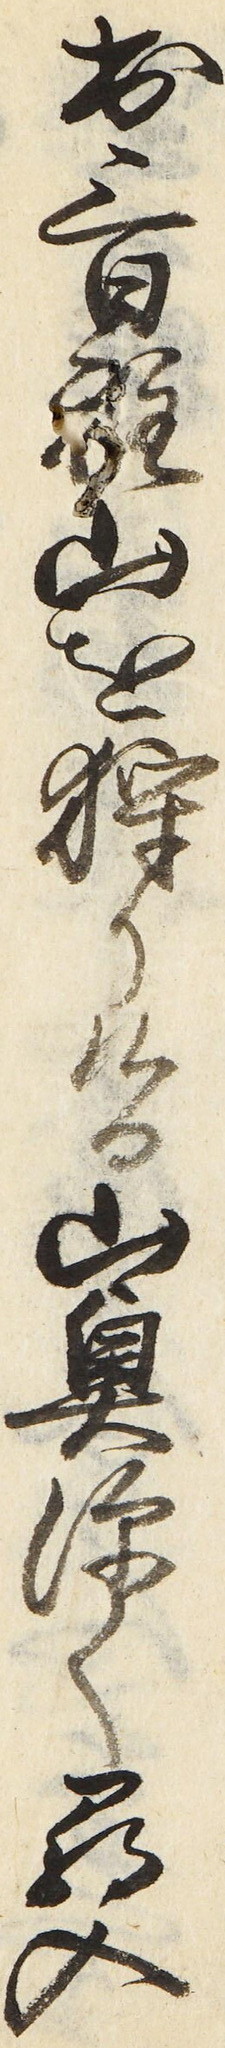出三日程山を狩りける山奥深く尋入
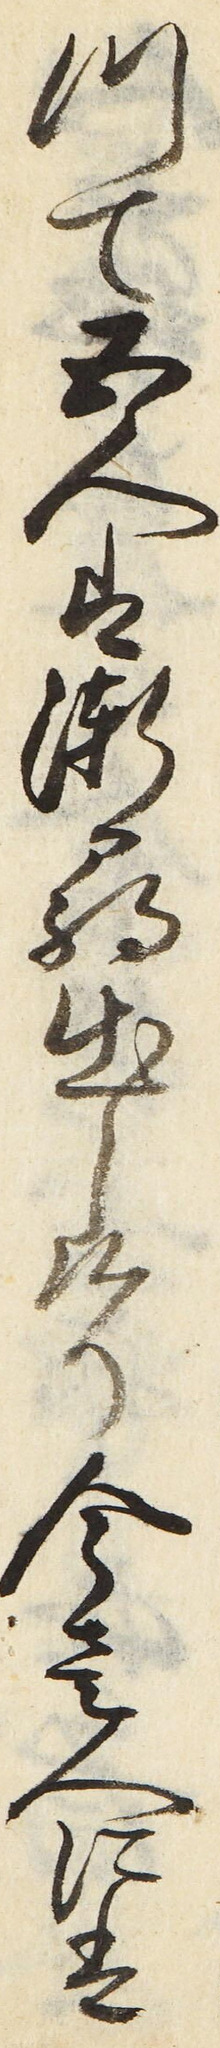つて五人は漸尋出しけり今壱人には
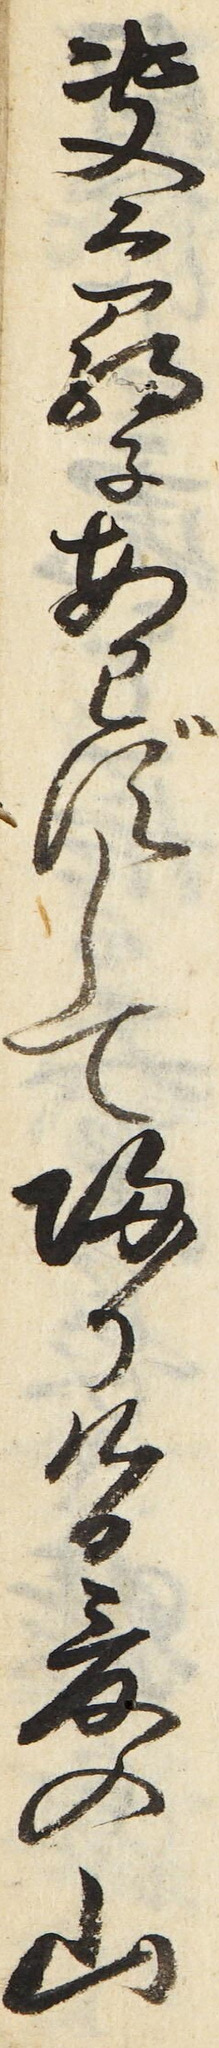決而尋ねあわずして帰りける爰の山

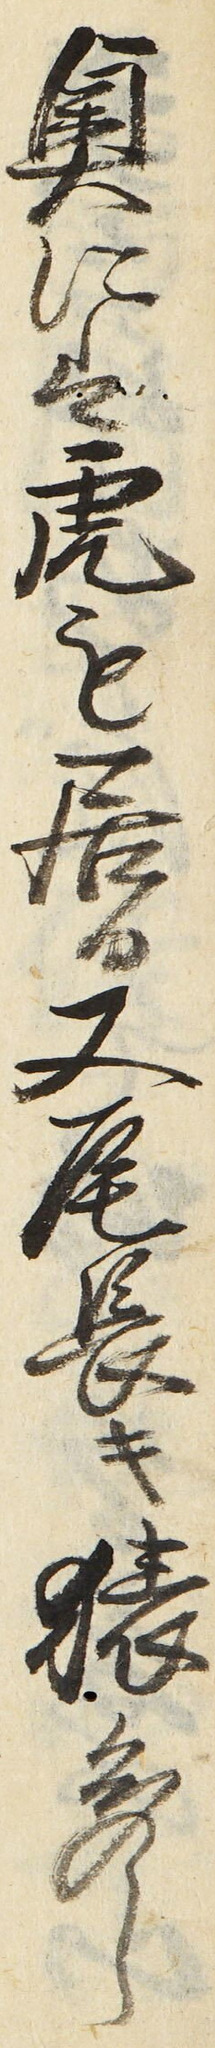奥には虎も居る又尾長き猿多し
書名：華夷九年録
